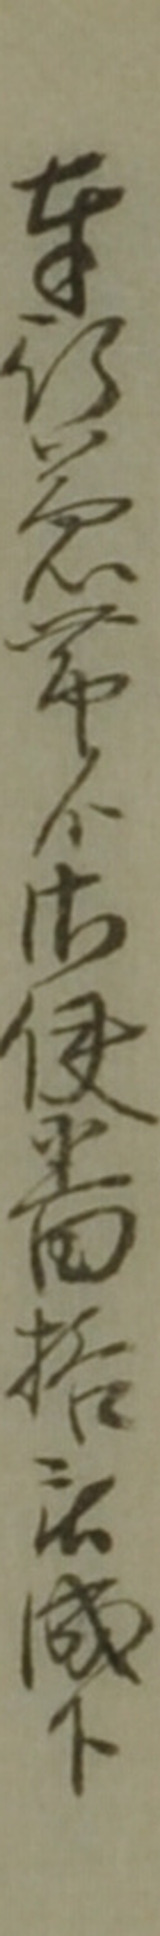奉行兼帯ゟ御使番格被成下
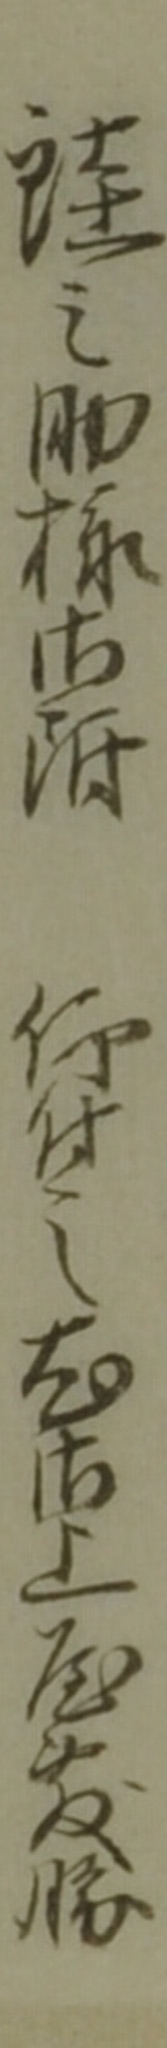銈之助様御附仰付之尤御上屋敷勝
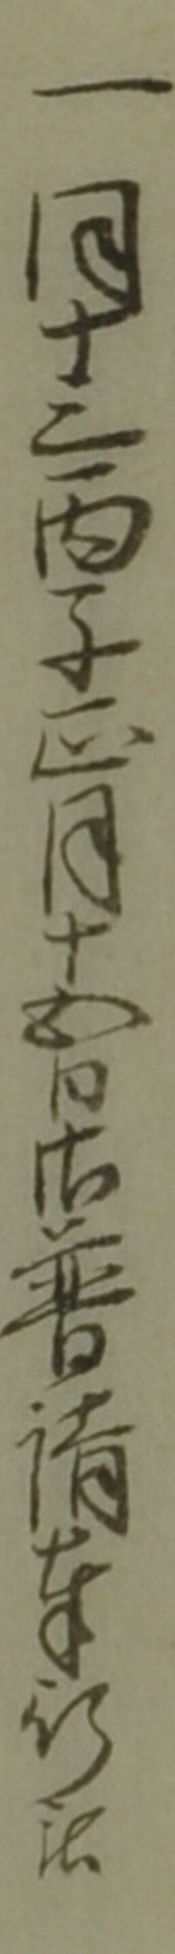一同十三丙子正月十五日御普請奉行被
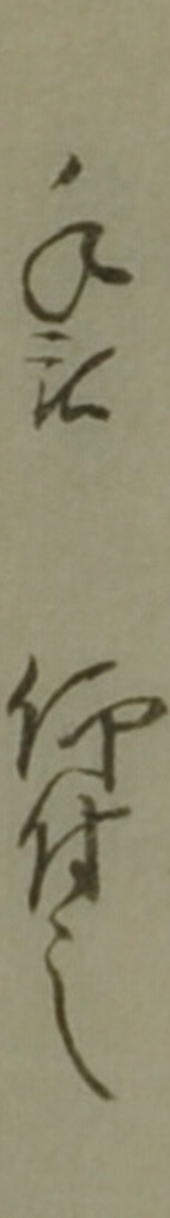手被仰付之
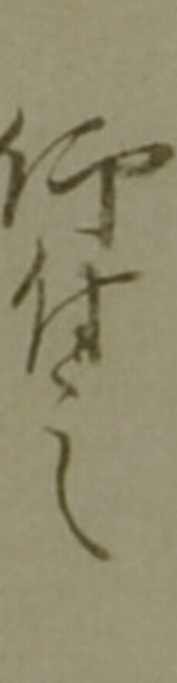仰付之
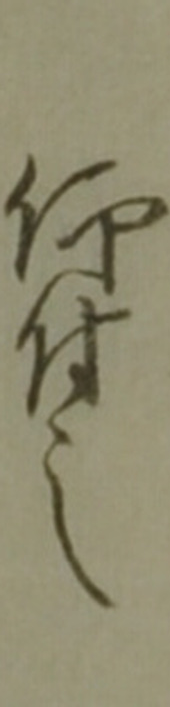仰付之
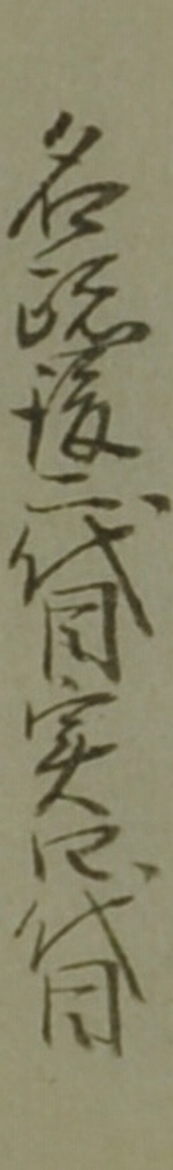名跡後二代目実四代目
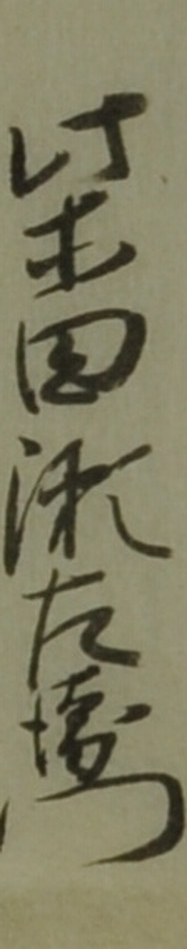柴田瀬左衛門
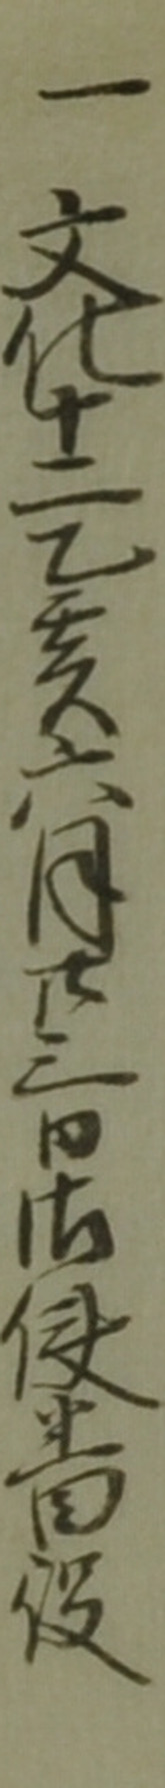一文化十二乙亥六月廿三日御使番役
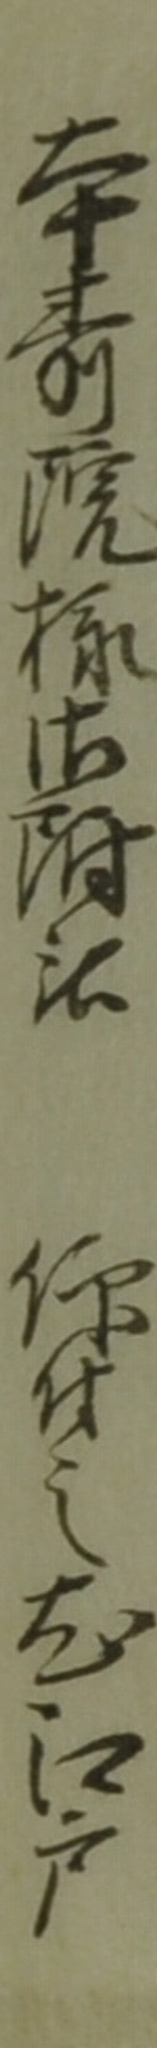本寿院様御附被仰付之尤江戸
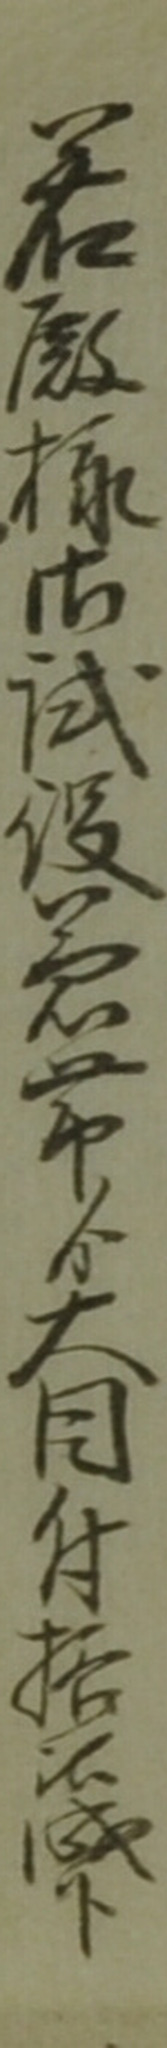若殿様御試役兼帯ゟ大目付格被成下
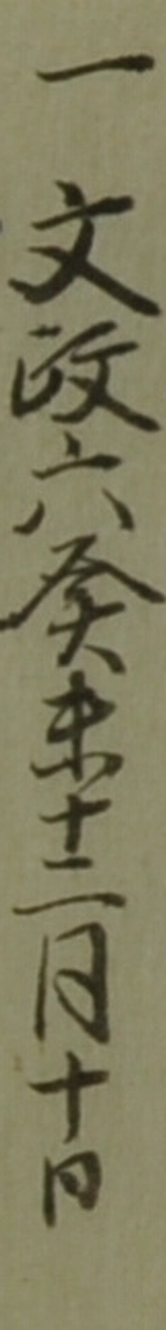一文政六癸未十二月十日
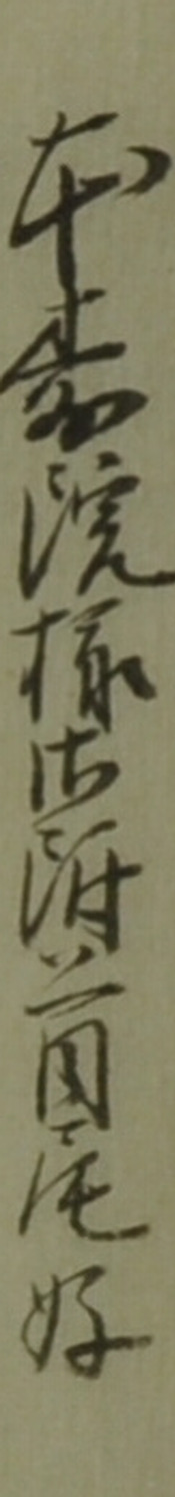本寿院様御附首尾好
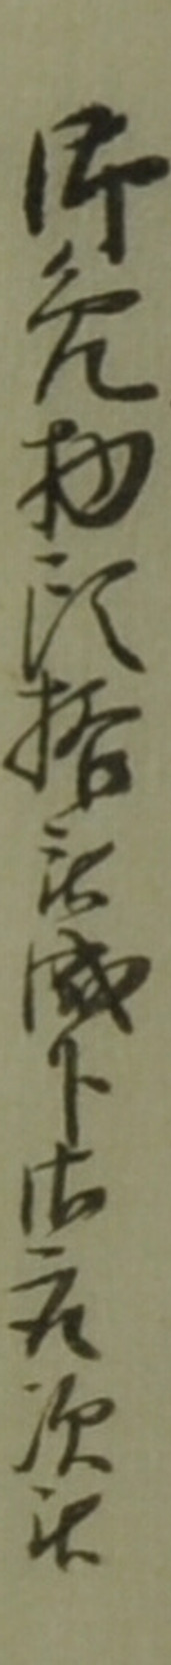御免物頭格被成下御取次被

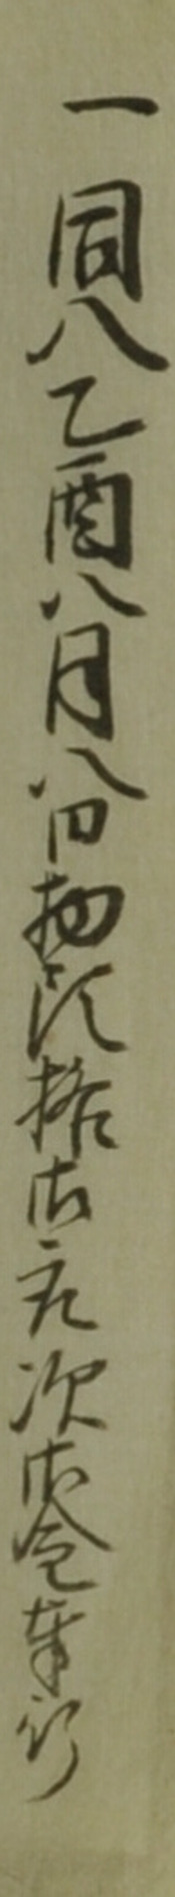一同八乙酉八月八日物頭格御取次御金奉行
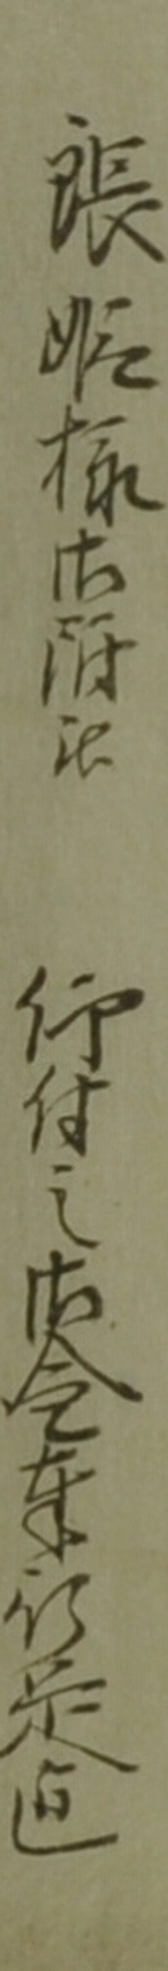鋹姫様御附被仰付之御金奉行是迄
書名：諸御役代々録（六）
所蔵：伊那市立高遠町図書館・合同会社AMANE
